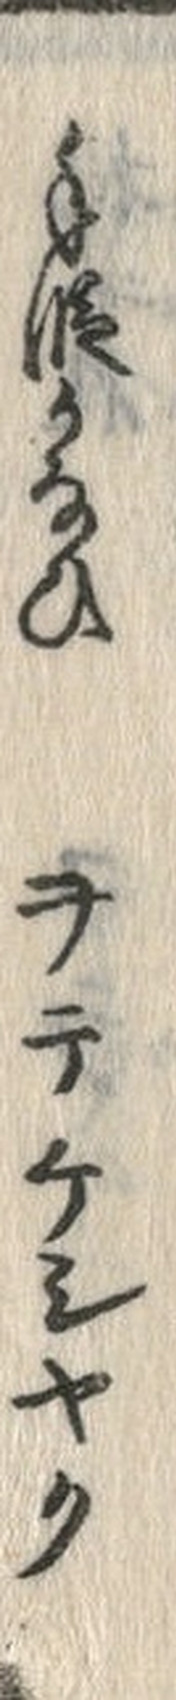手段かなひヲテケシヤク
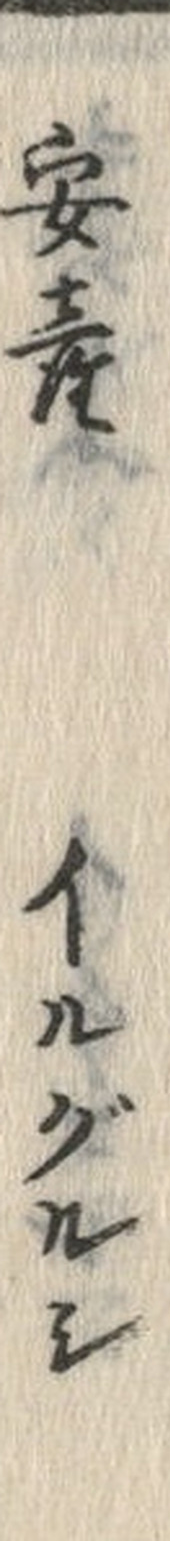安産イルグルシ
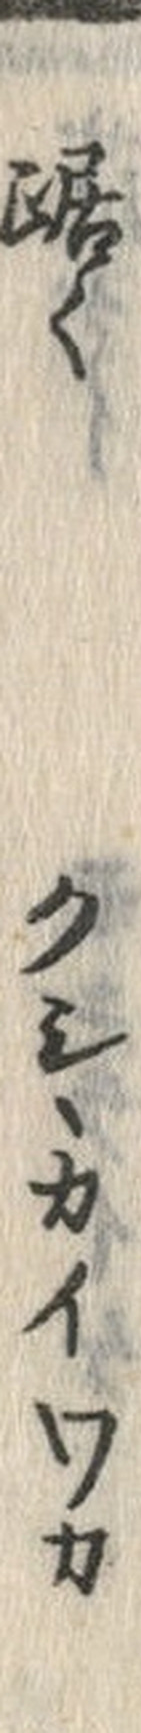踞くクシヽカイツカ
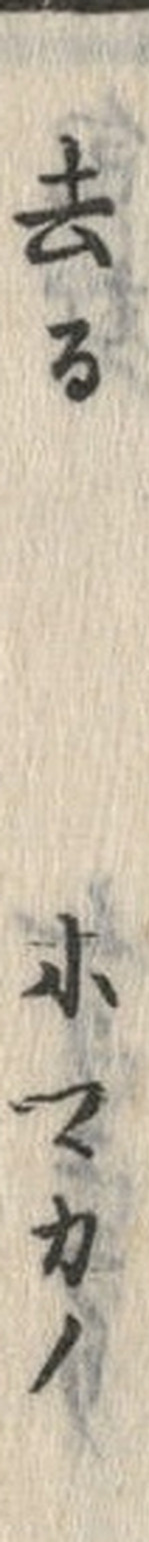去るホマカノ
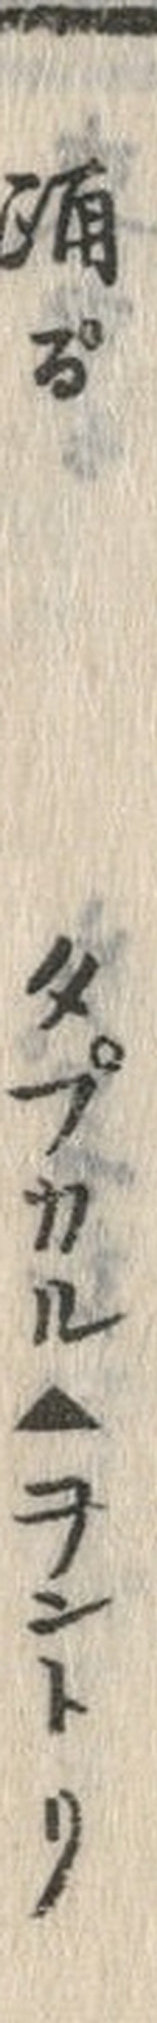踊るタプカル▲ヲントリ

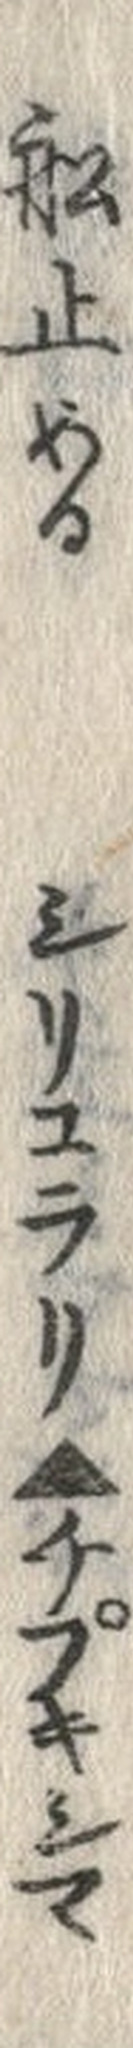舩止めるシリユラリ▲チプキシマ

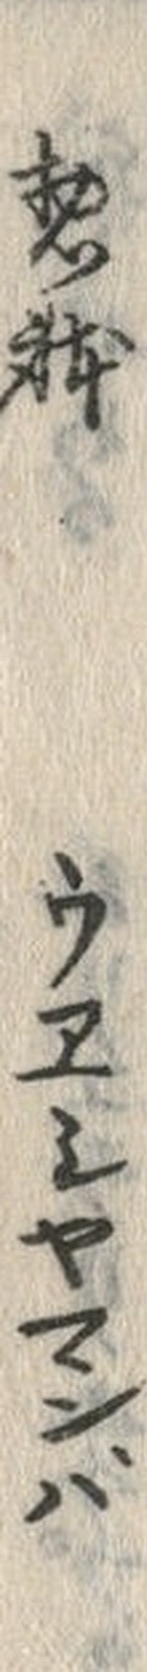惣体ウヱシヤマンバ
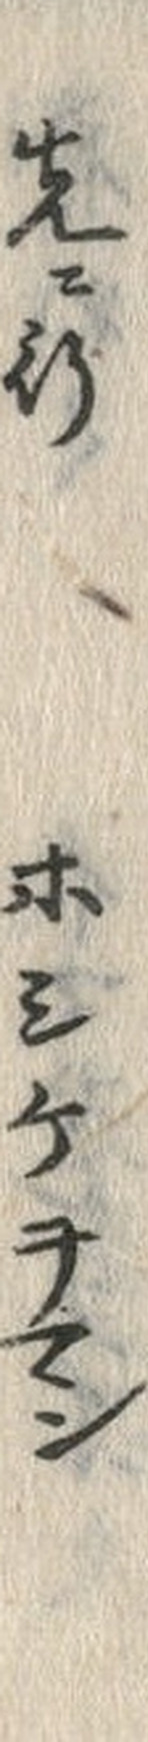先に行ホシケヲマン
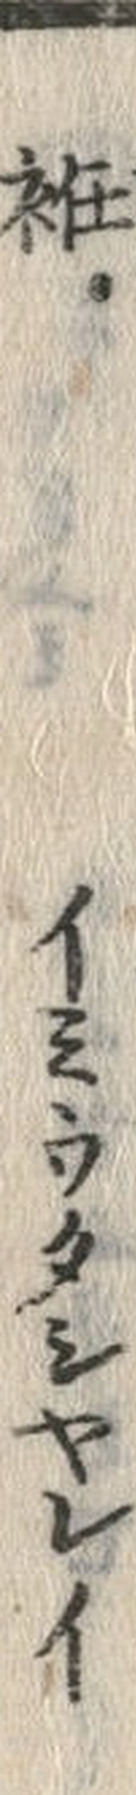袵イミウタシヤレイ
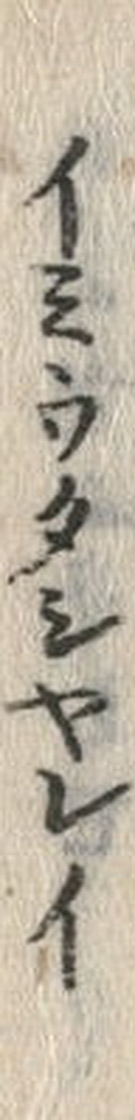袵イミウタシヤレイ

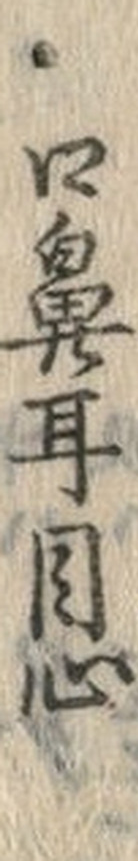口鼻耳目心

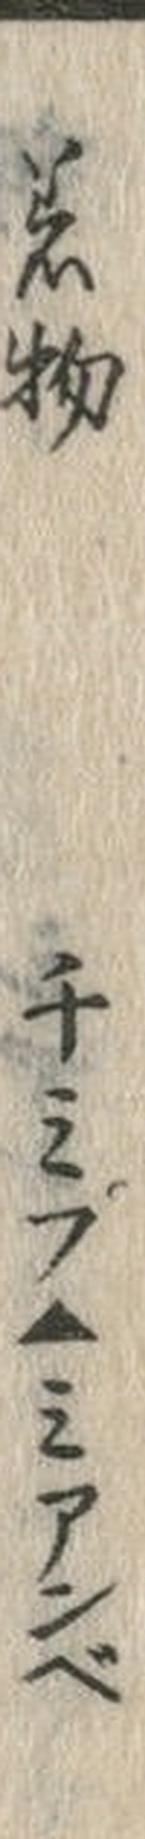着物ミチプ▲ミアンベ
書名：蝦夷方言藻汐草　乾巻
